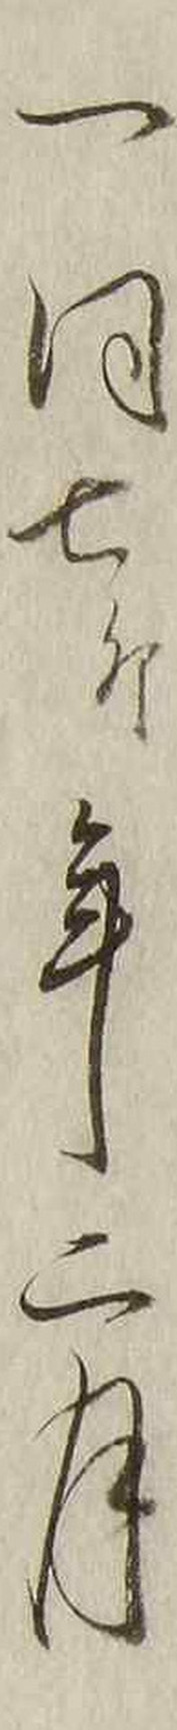一同七卯年二月

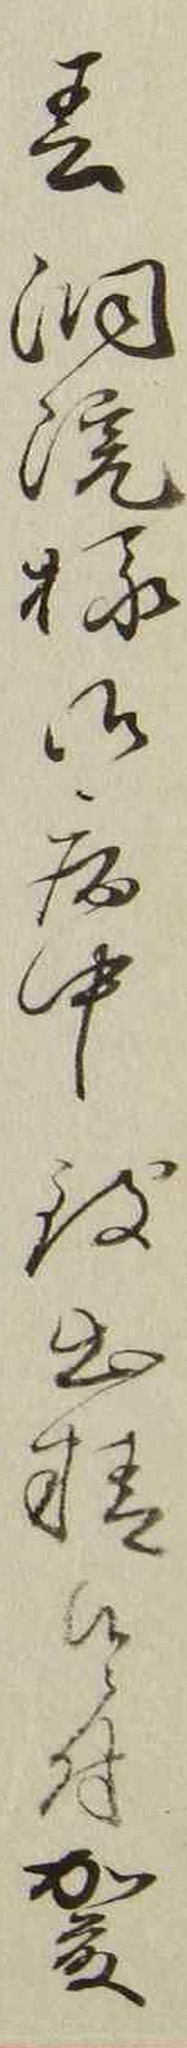春洞院様御病中致出精候ニ付加藤
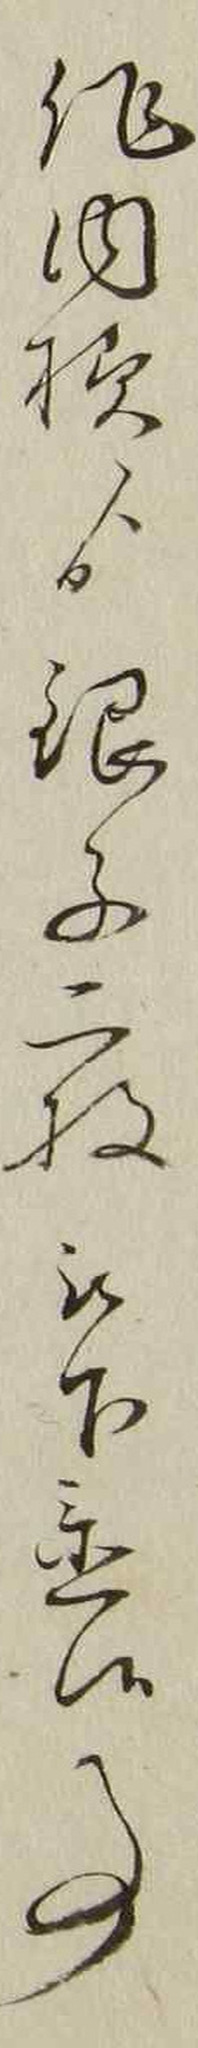作内様より銀子二枚被下置候事
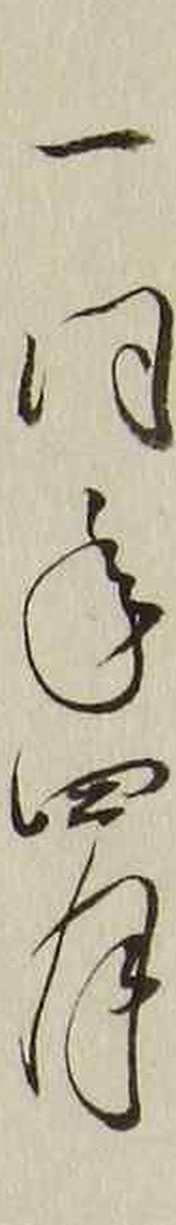一同年四月
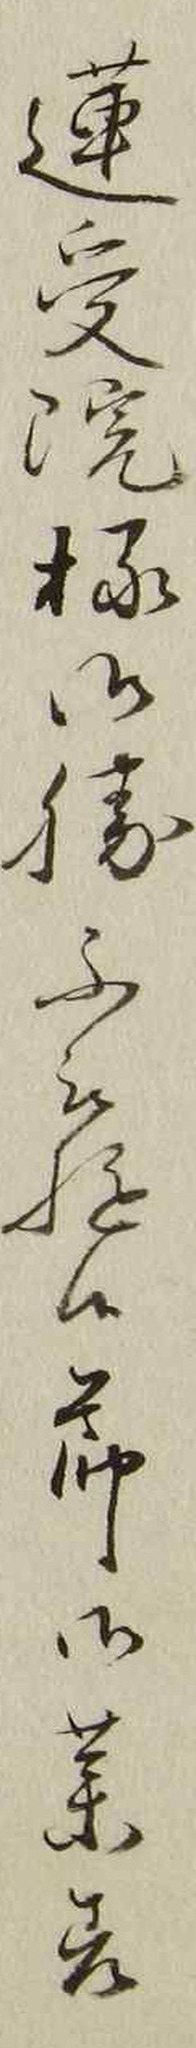連受院様御勝不被遊候節御薬差
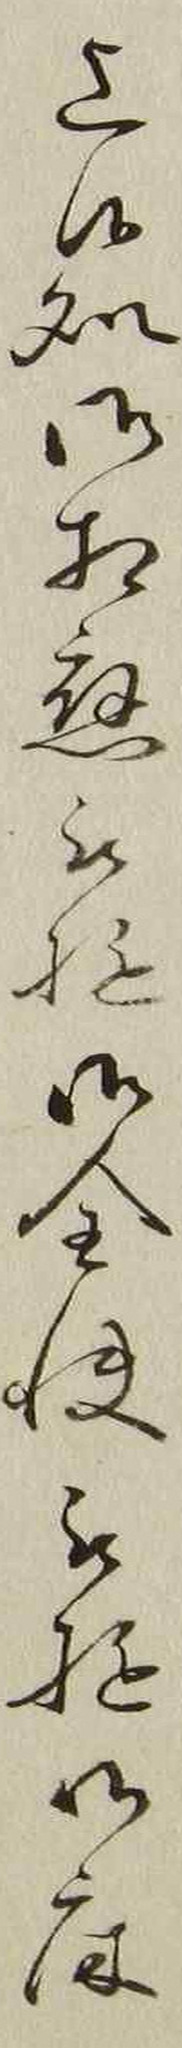上候処御相応被遊御全快被遊御床
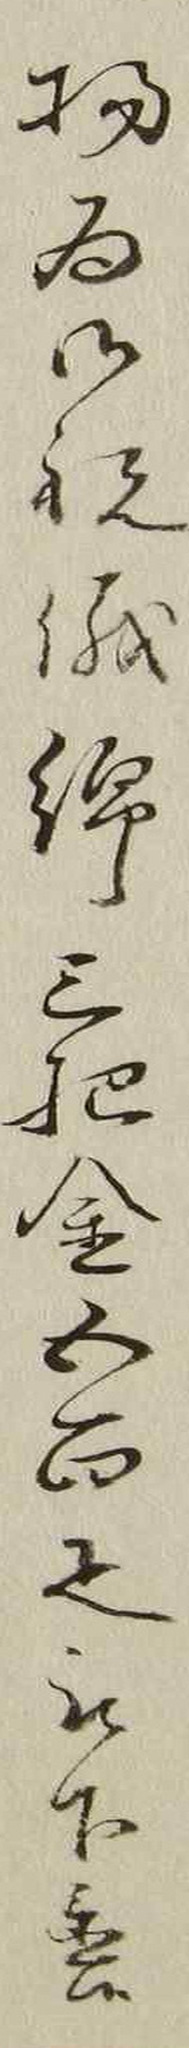揚為御祝儀綿三把金五百疋被下置候
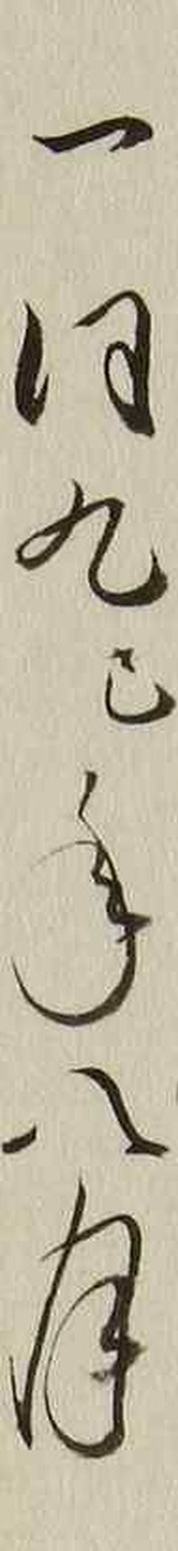一同九巳年八月
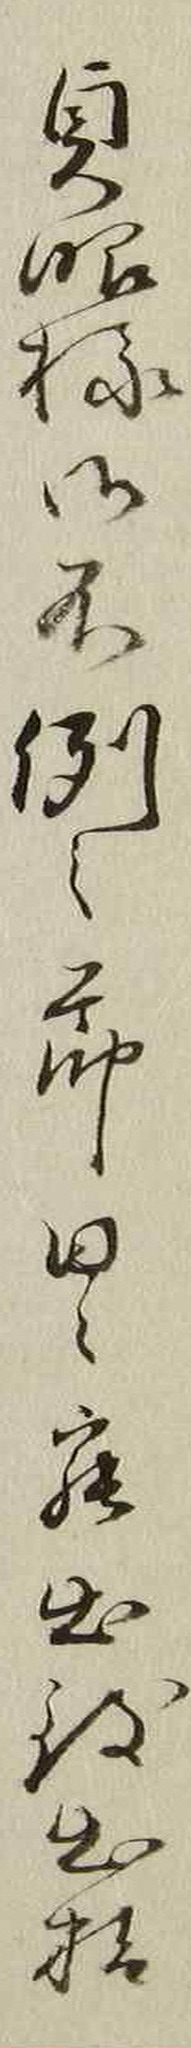貞昭様御不例之節日々罷出致出精
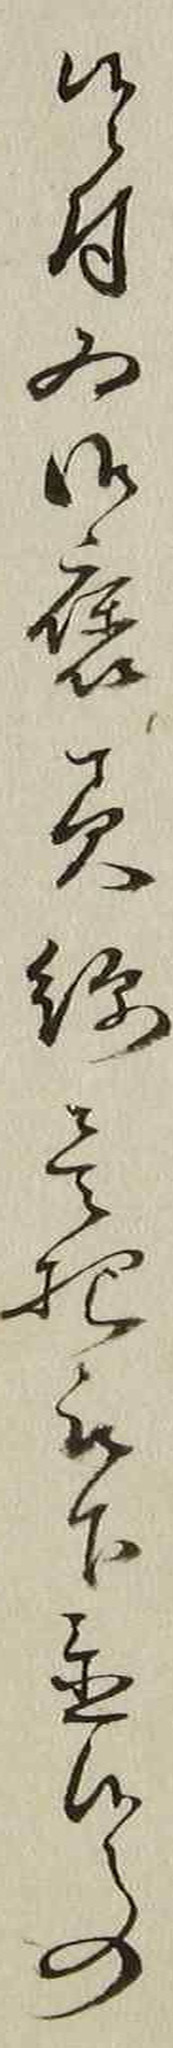候ニ付為御褒美綿壱把被下置候事
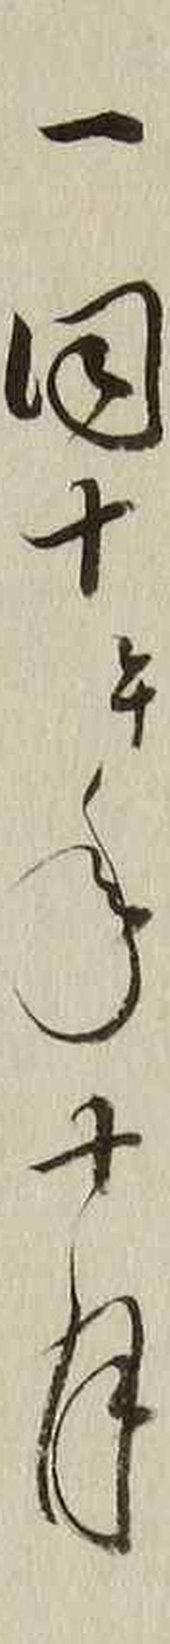一同十午年十月
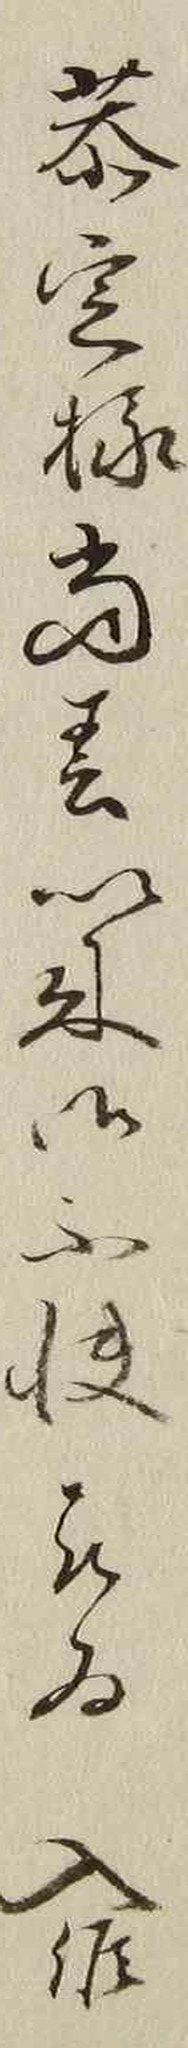恭定様当春以来御不快被為入候
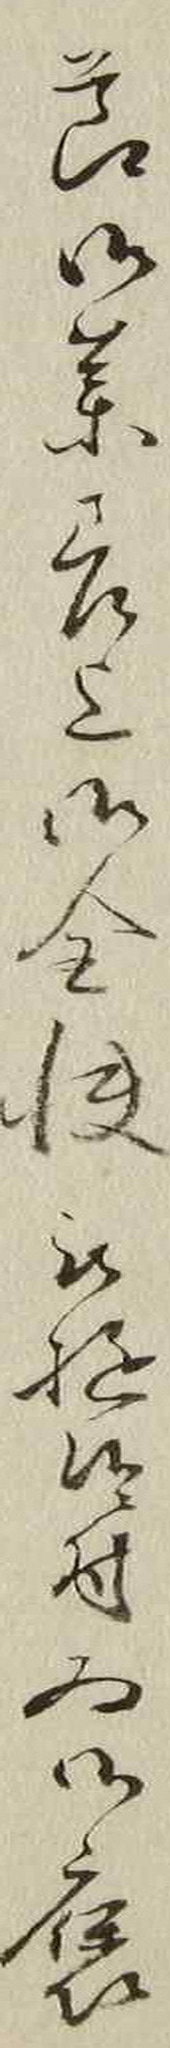節御薬差上御全快被遊候ニ付為御褒
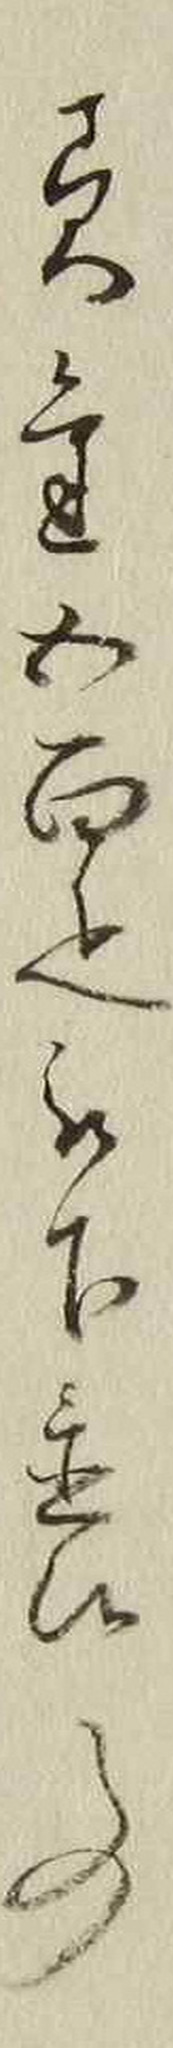美金五百疋被下置候事
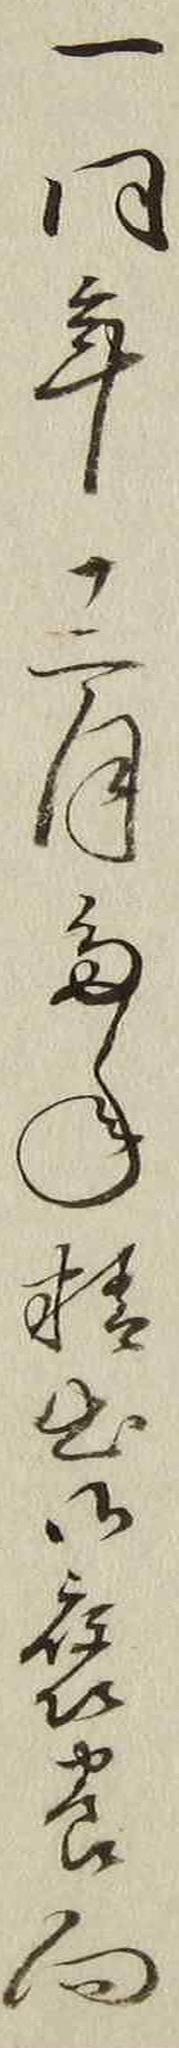一同年十二月多年精出御褒養向
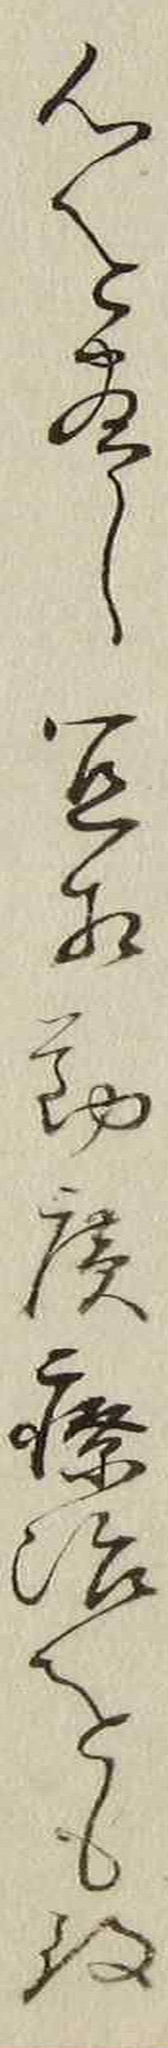心を尽し宜相勤広療治をも致
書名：諸士系譜　巻之8　い之部8
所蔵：会津若松市立会津図書館
